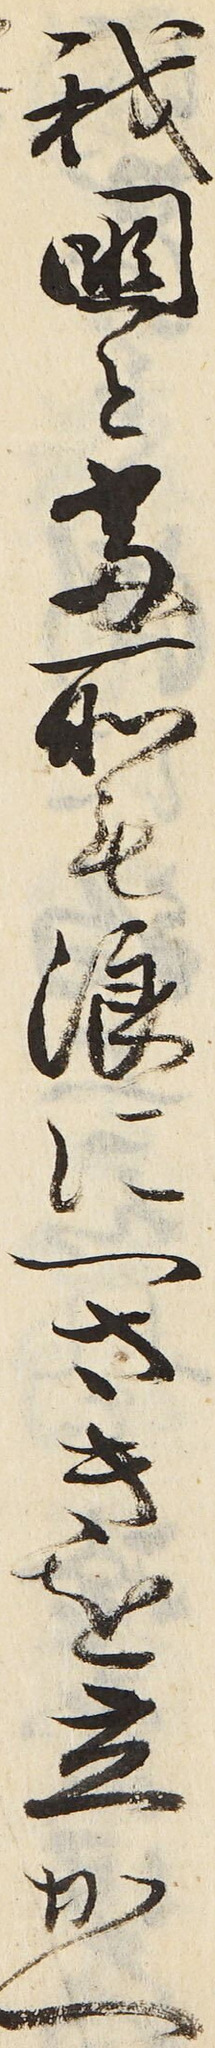我国と当所も浪にへさきを立かへ
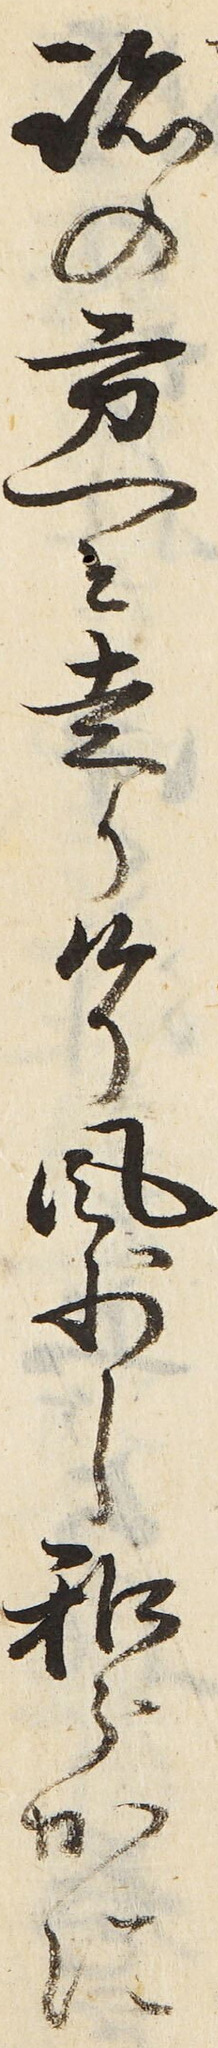跡の方へと走りけり風少し和らかに
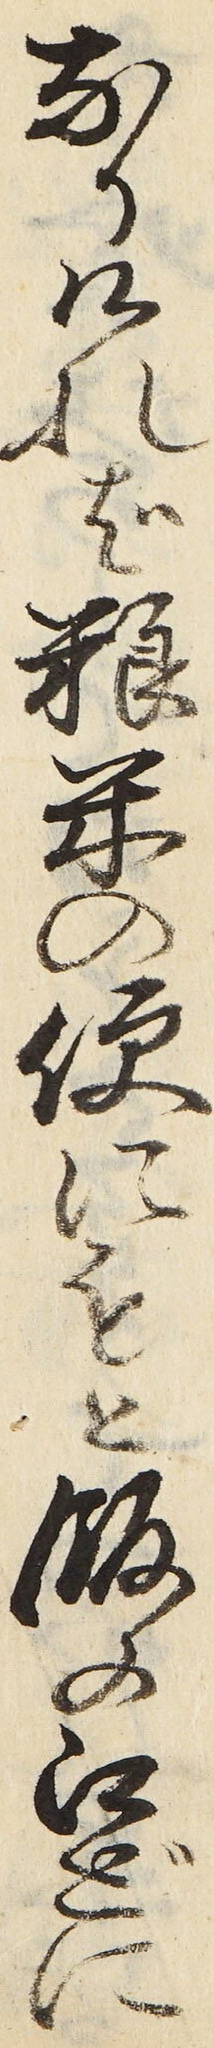なりければ粮米の便にもと飯の江どに
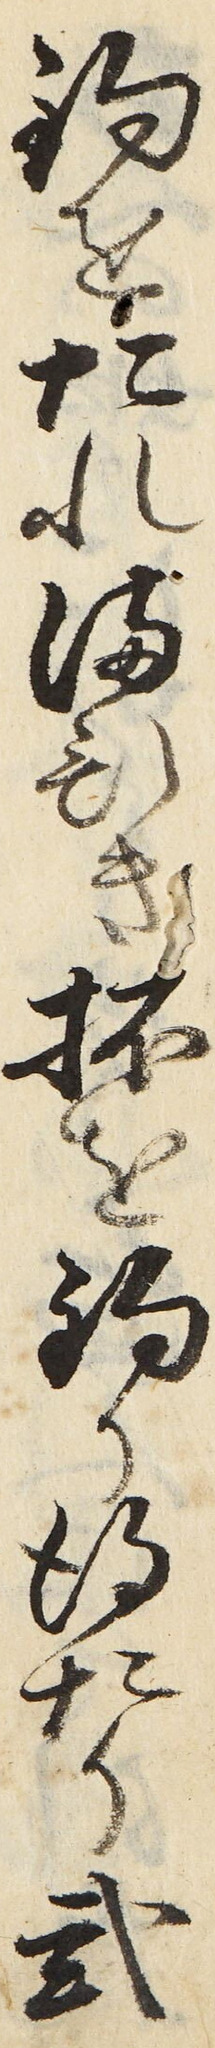釣をたれまひき抔を釣り得たり弐
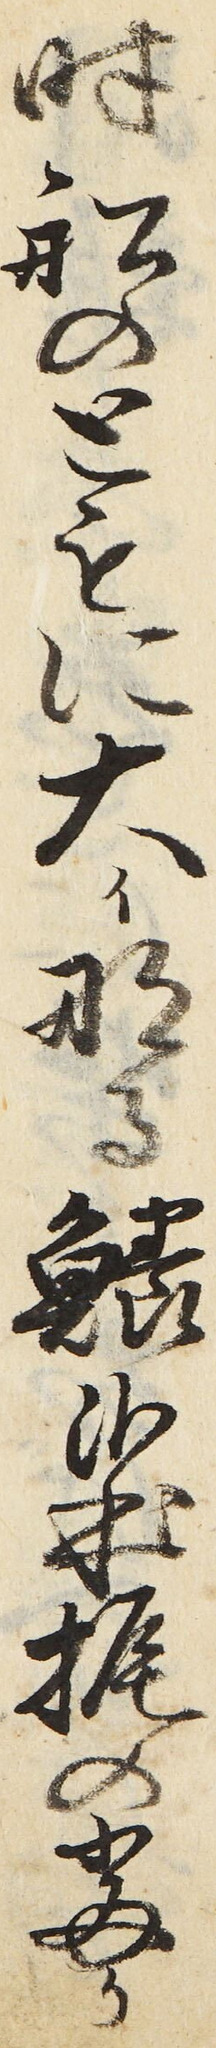時船ともに大いなる鱶弐本梶の当り
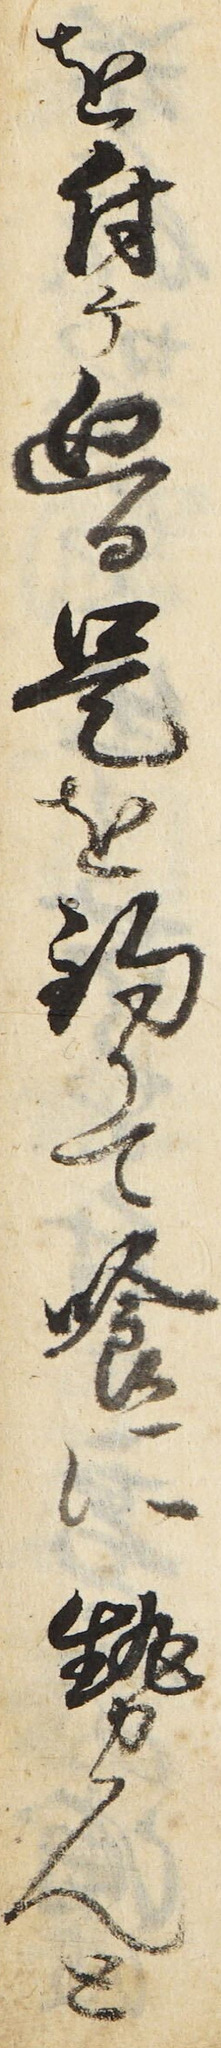を付け廻る是を釣りて喰にせんと

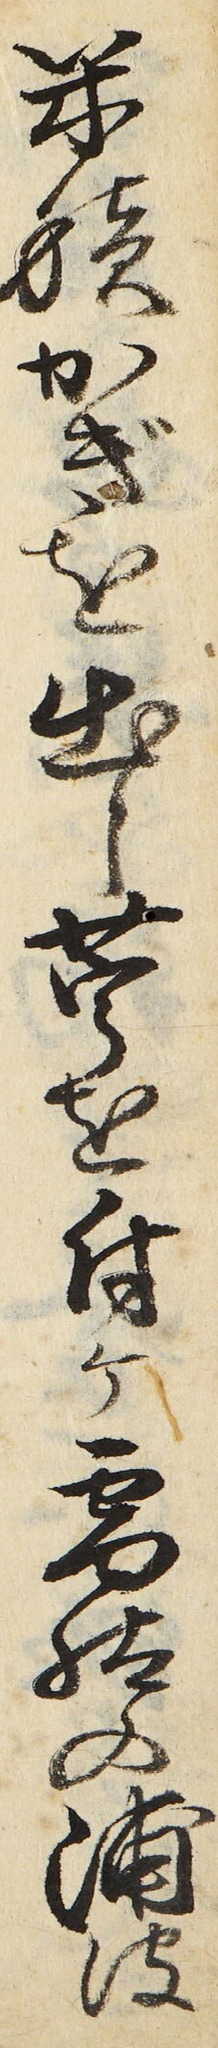米積かぎを出し苧を付け雪駄の浦皮
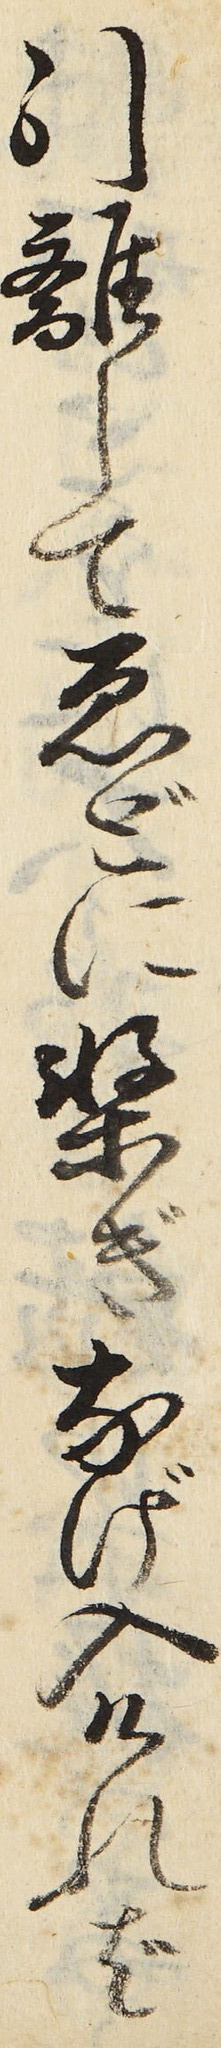引離してゑどに繋ぎなげ入ければ
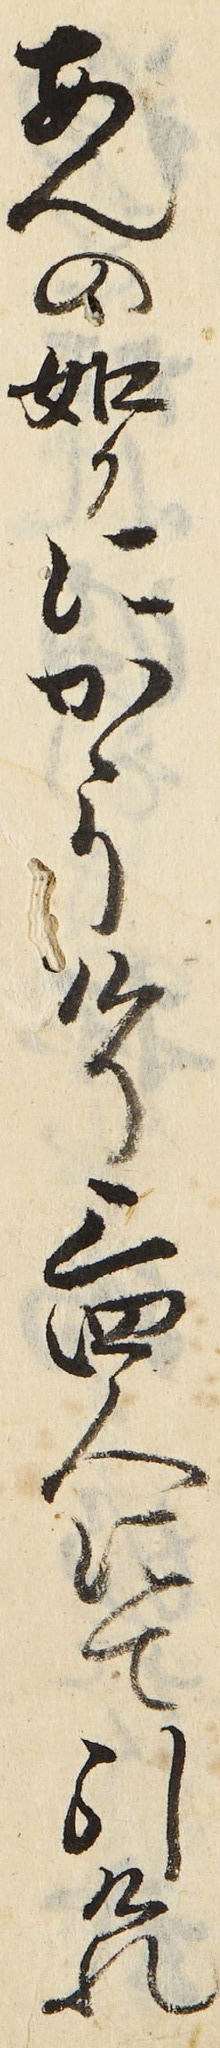あんの如くにかゝりけり三四人にて引けれ
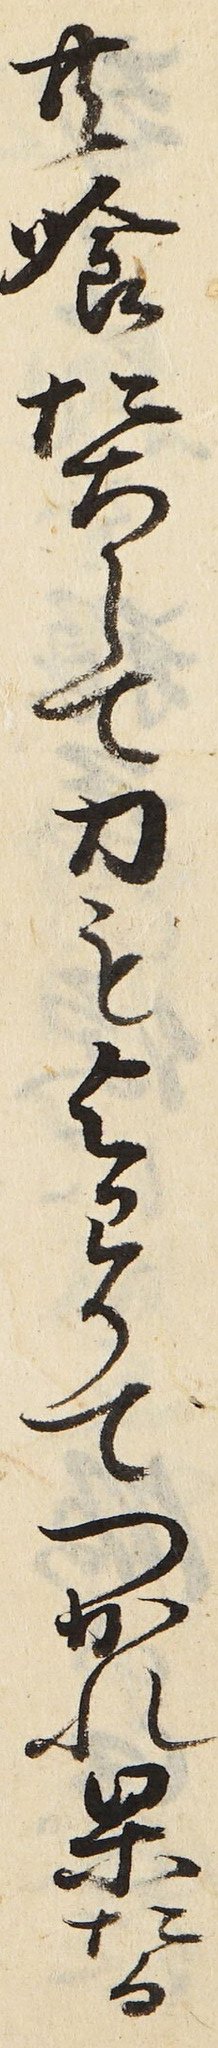共喰たちして力もよわりてつかれ果たる
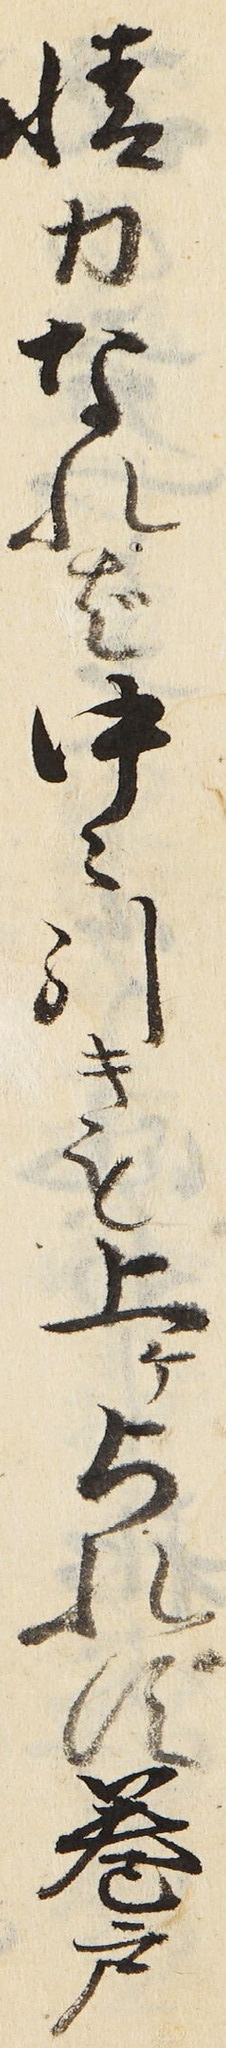情力なれば中々引きも上けられず巻戸
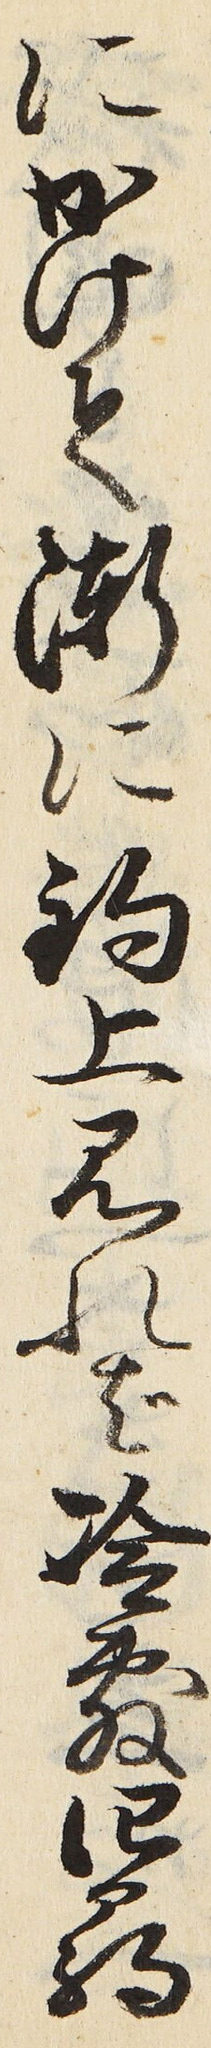にかけて漸に釣上見れば冷敷四尋
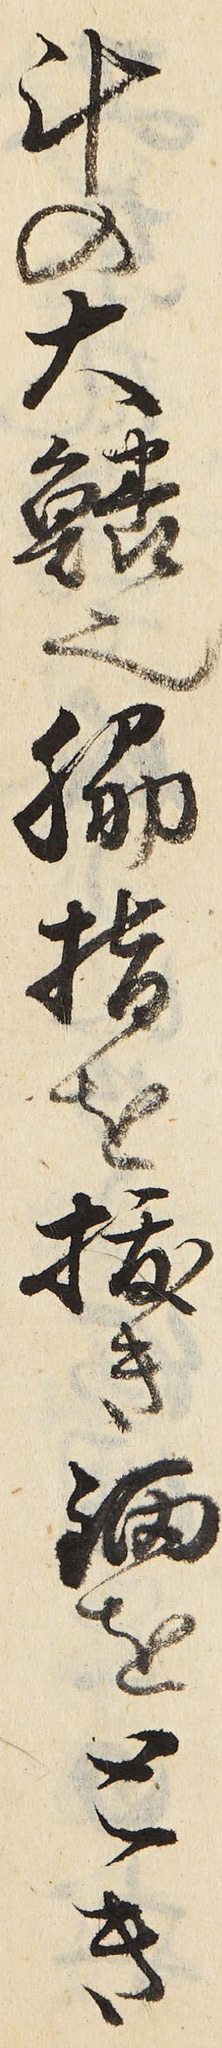計の大鱶也脇指を抜き錨をとき
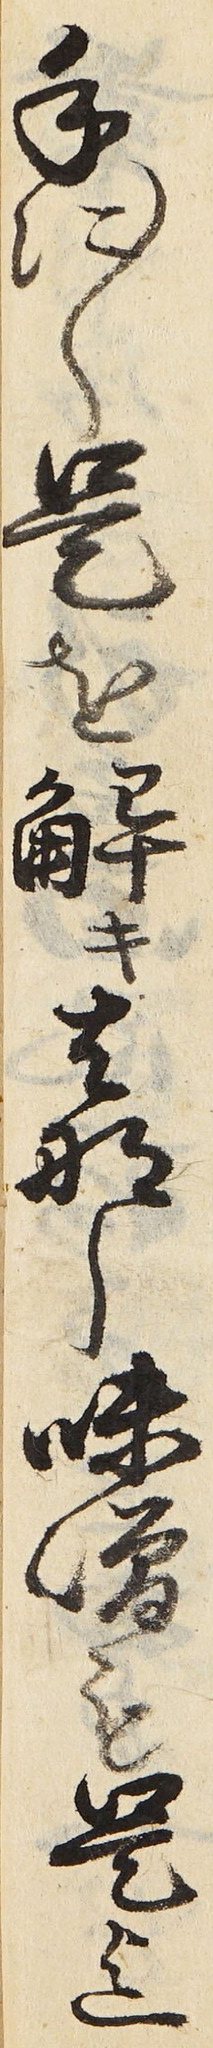手に〳〵是を解きはなし味噌も是迄
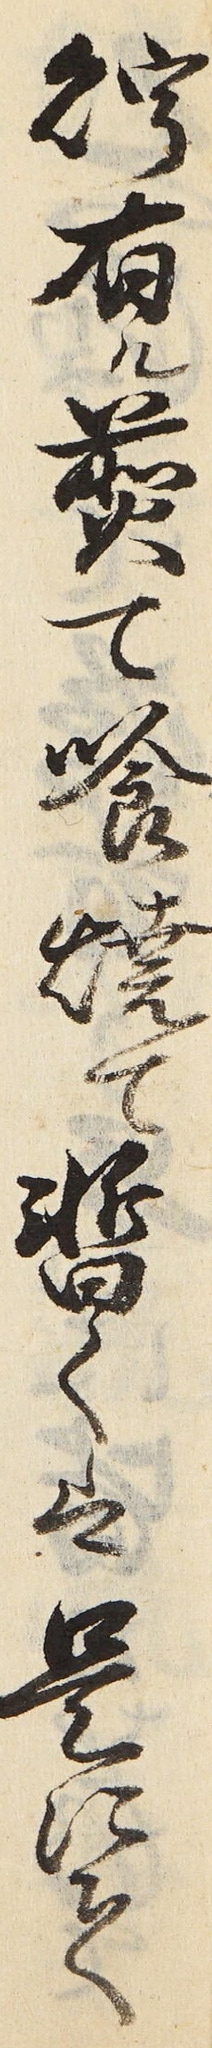貯有る煎て喰焼て暫くは是にて
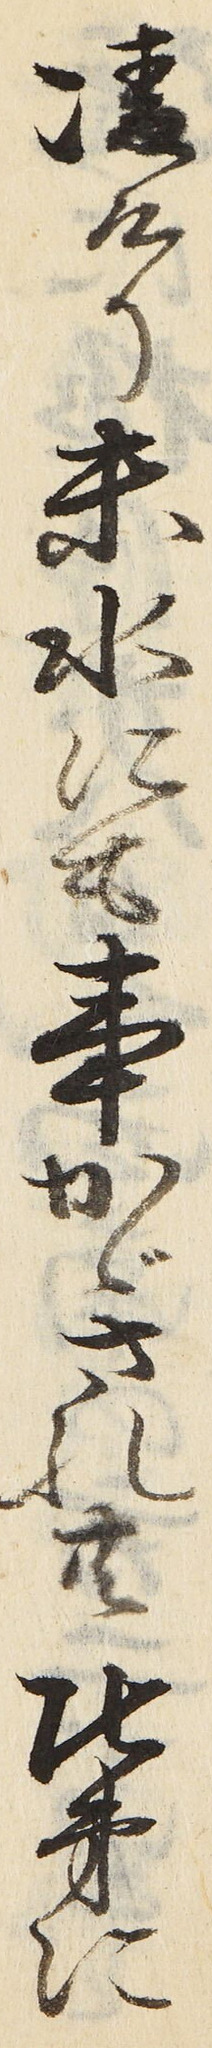凌けり未水にも事かゞされ共次第に
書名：華夷九年録
